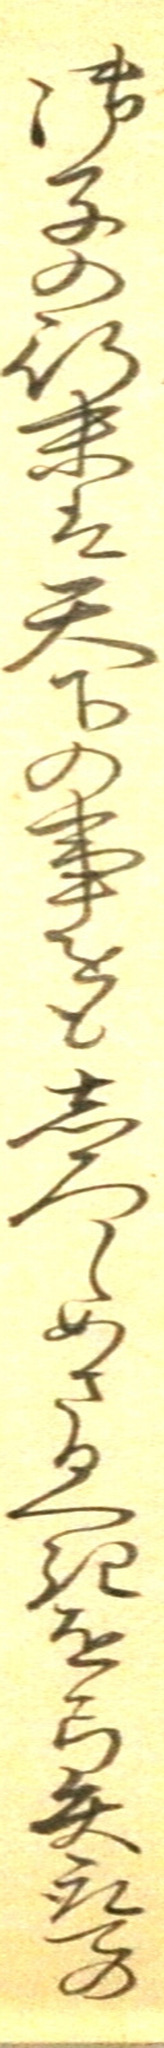御子の行末は天下の事をもしろしめさるへきを弓矢取ての
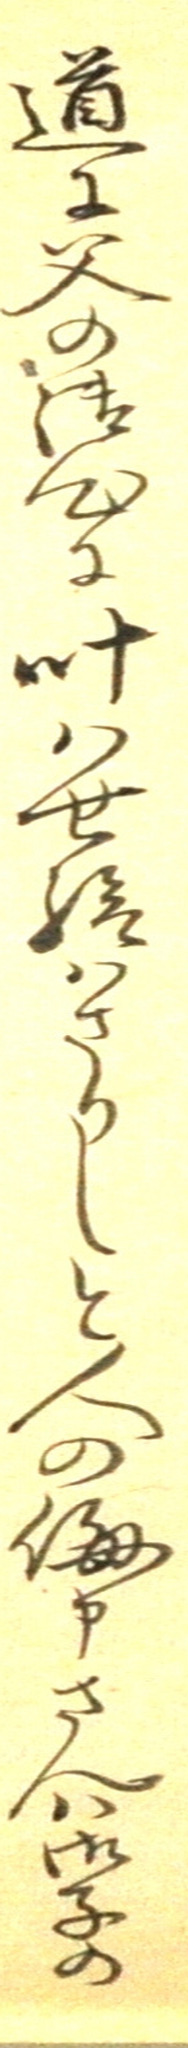道に父の御心に叶はせ給はさりしと人の侮申さんは御子の
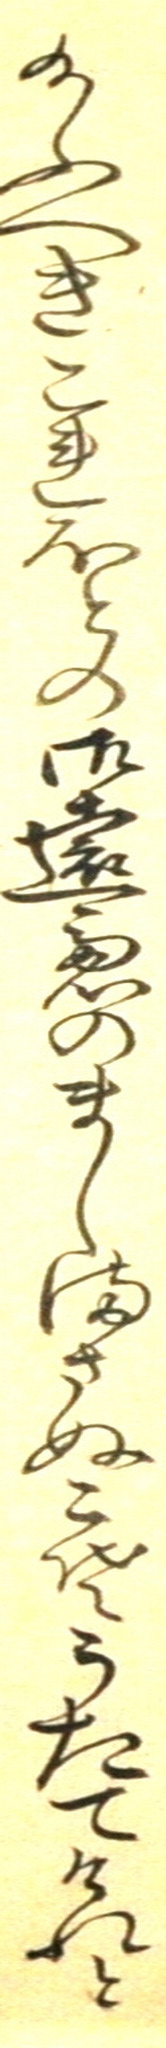給ふへきこれほとの御遠慮のましまさぬこそうたてけれと
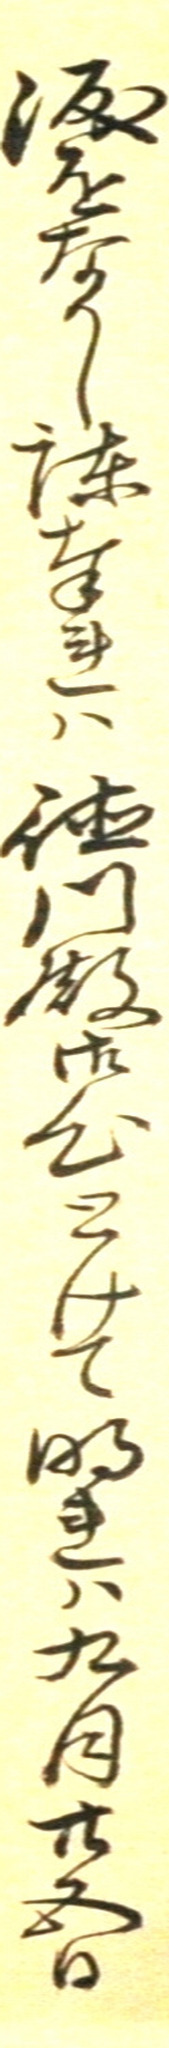涙をなかし諫奉れは徳川殿御心とけて明れは九月廿五日
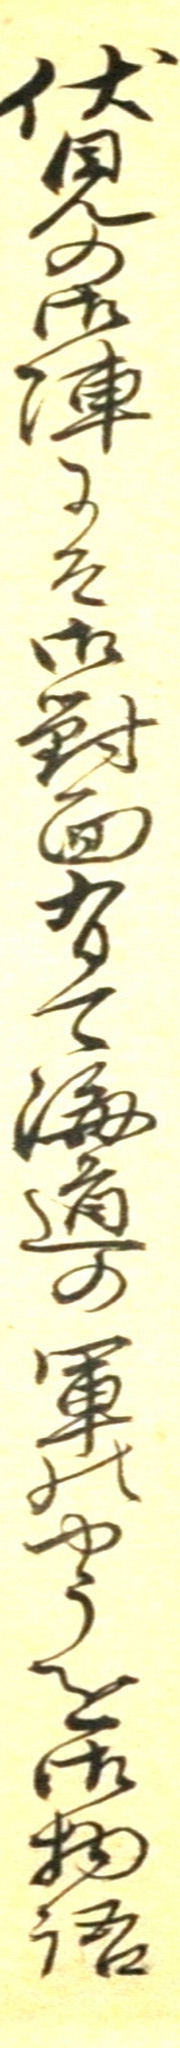伏見の御陣にそ御対面有て海道の軍のやうを御物語
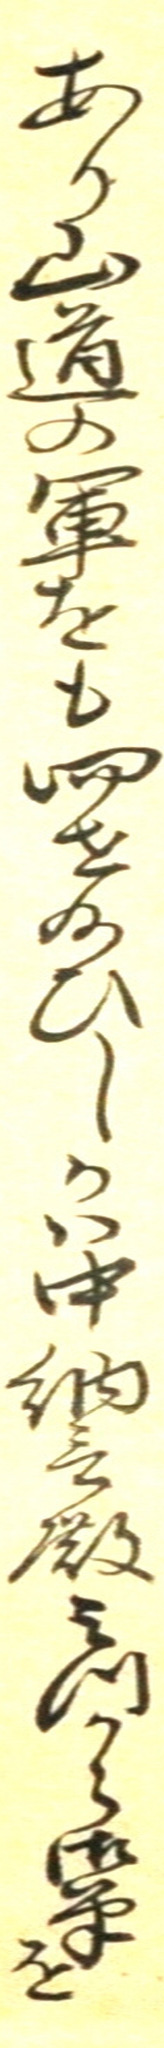あり山道の軍をも向せ給ひしかは中納言殿みつから御筆を
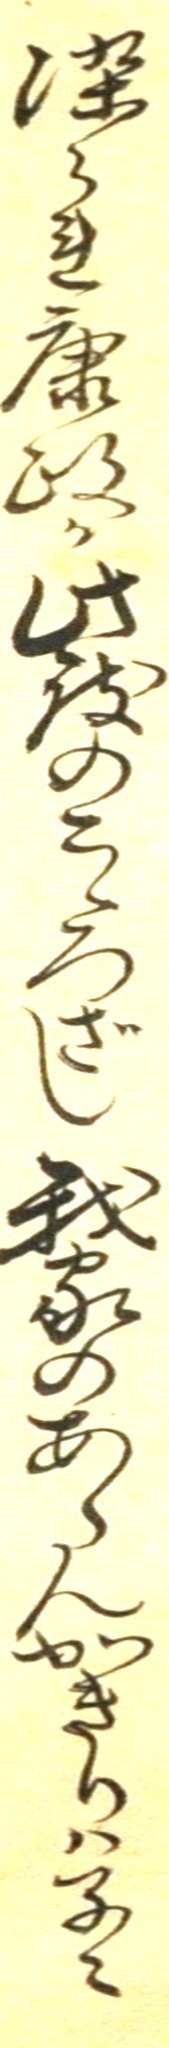染られ康政か此度のこゝろざし我家のあらんかきりは子々
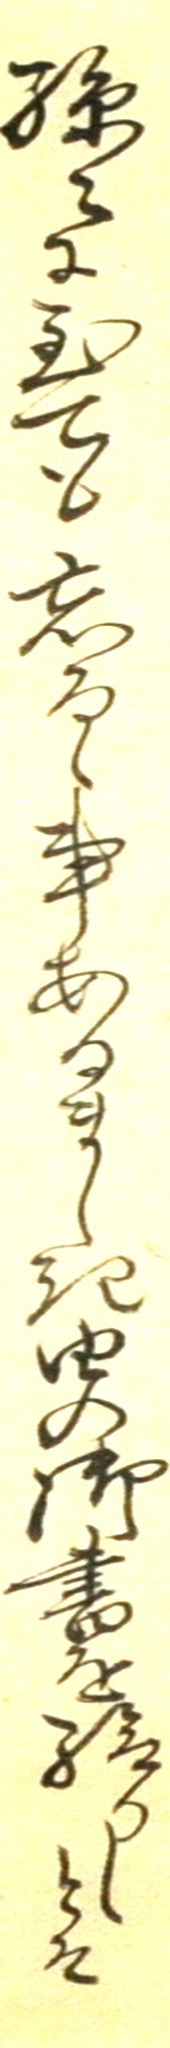孫々に至ても忘るゝ事あるましき由の御書を給りしとそ
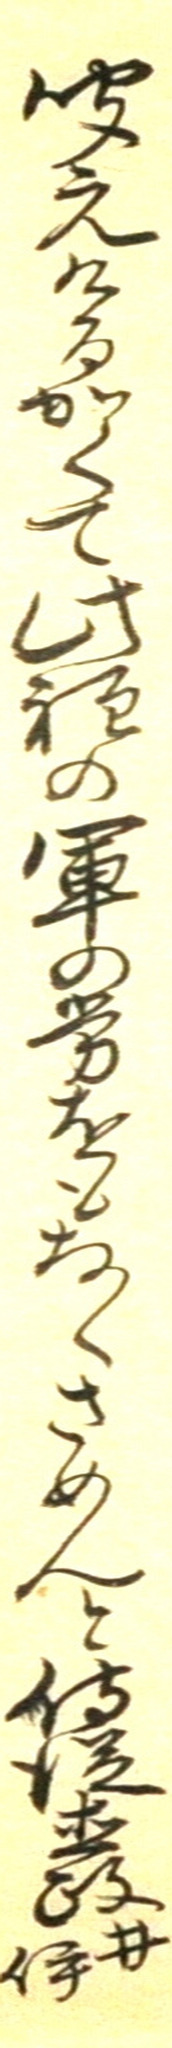聞えけるかくて此程の軍の労をもなくさめんと侍従直政井伊
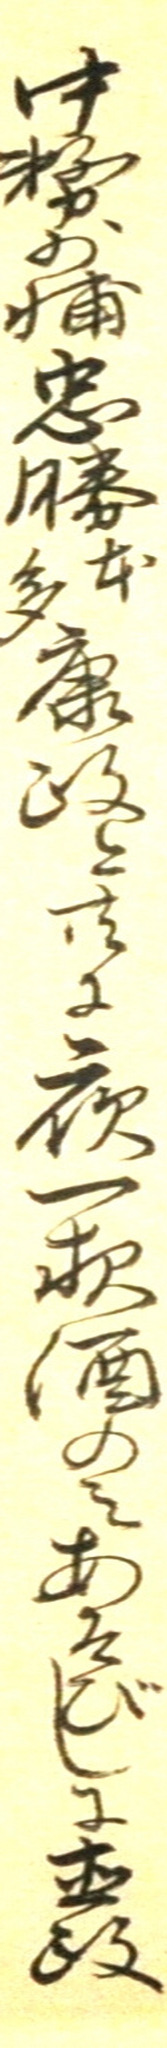中務少輔忠勝本多康政と共に夜一夜酒のみあそびしに直政
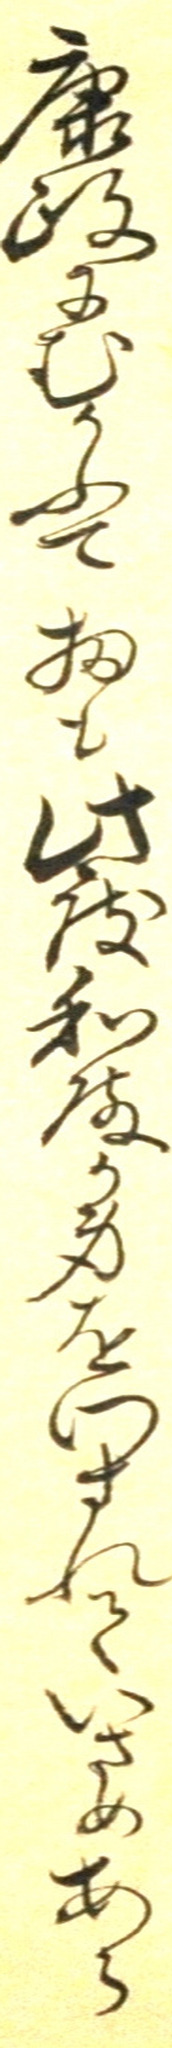康政にむかふて扨も此度和殿か身をわすれていさめあら
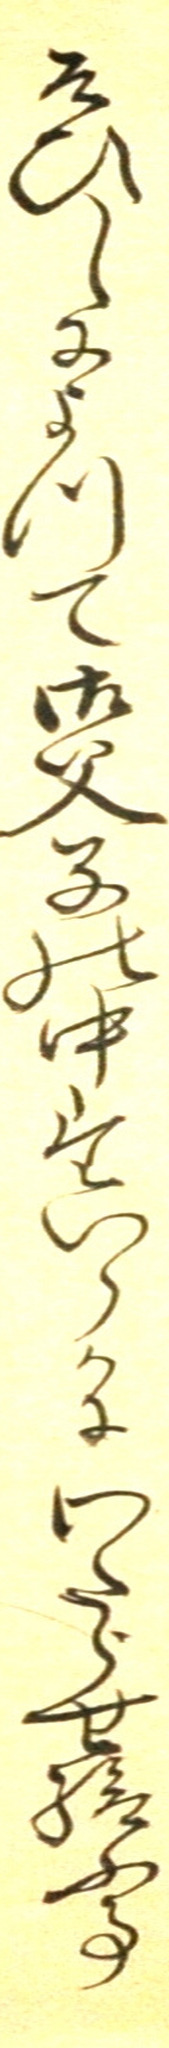そひしによつて御父子の中たいらかにわたらせ給ふ事
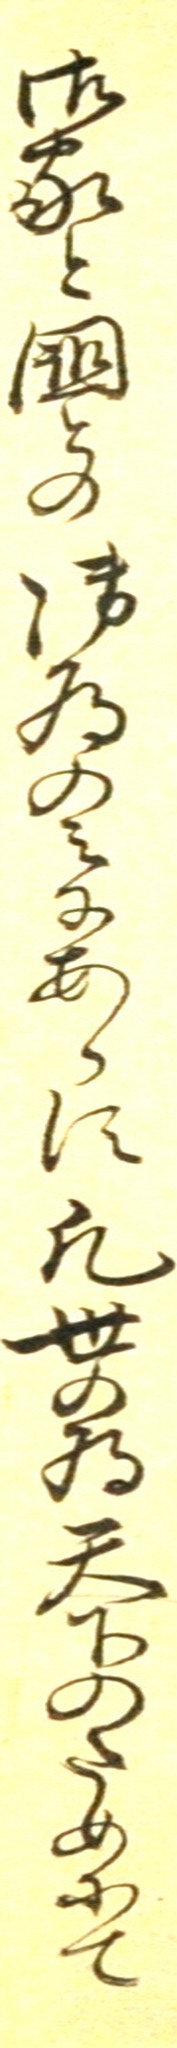御家と国との御為のみにあらす凡世の為天下のためにて
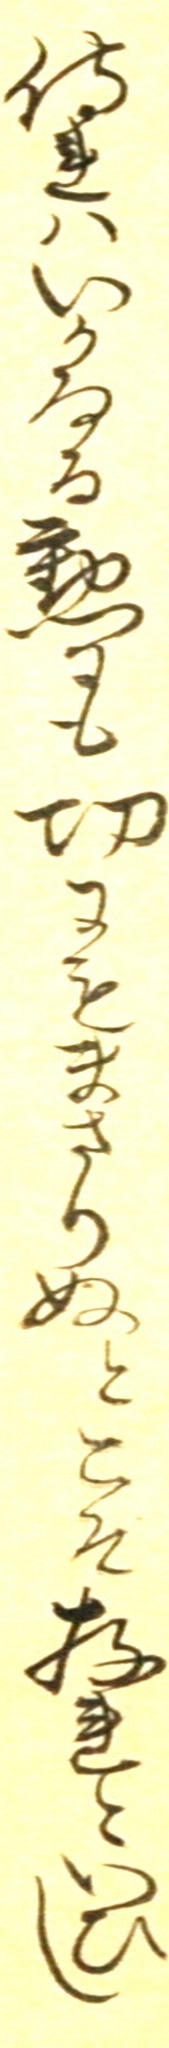侍れはいかなる勲にも功にもまさりぬとこそ存れといひし

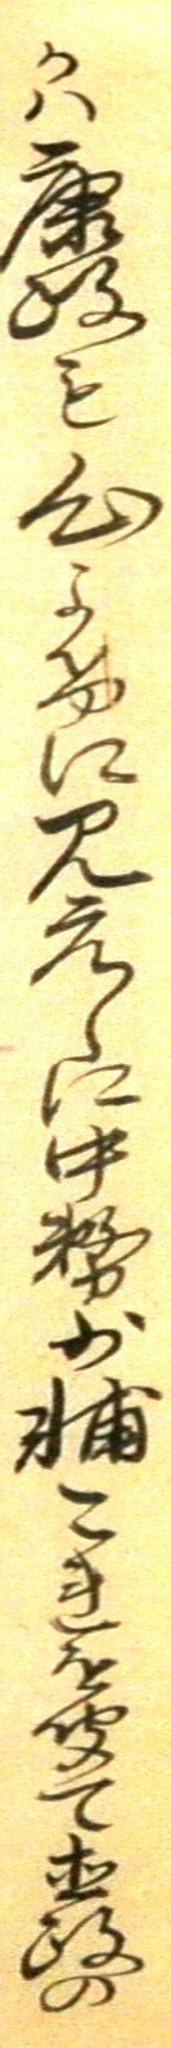かは康政も心よけに見えしに中務少輔これを聞て直政の
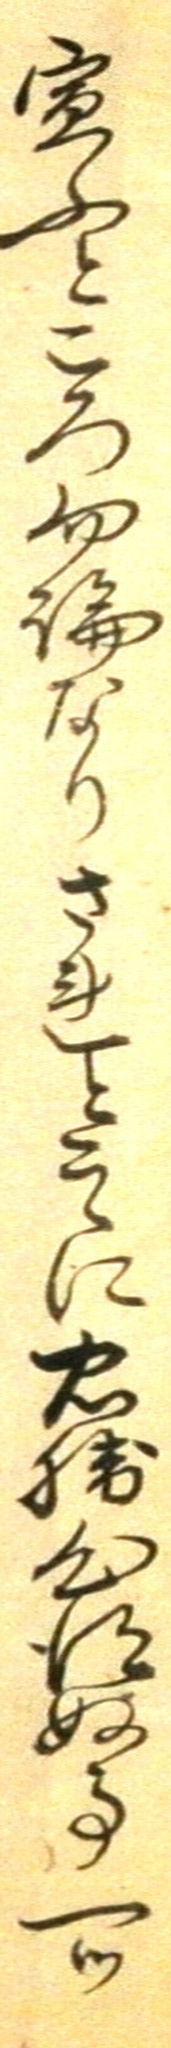宣ふところ勿論なりされとこゝに忠勝心得ぬ事一ツ
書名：藩翰譜（四・上）
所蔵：伊那市立高遠町図書館・合同会社AMANE
